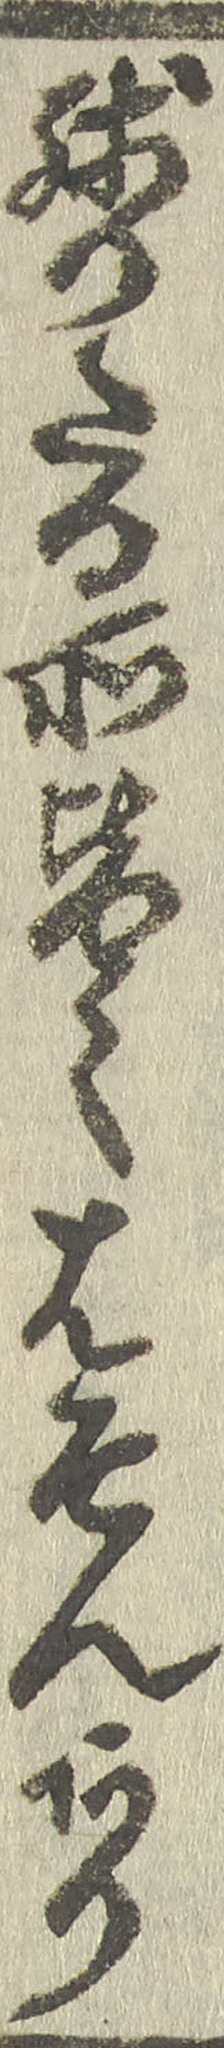残りたる所皆々はそんあり
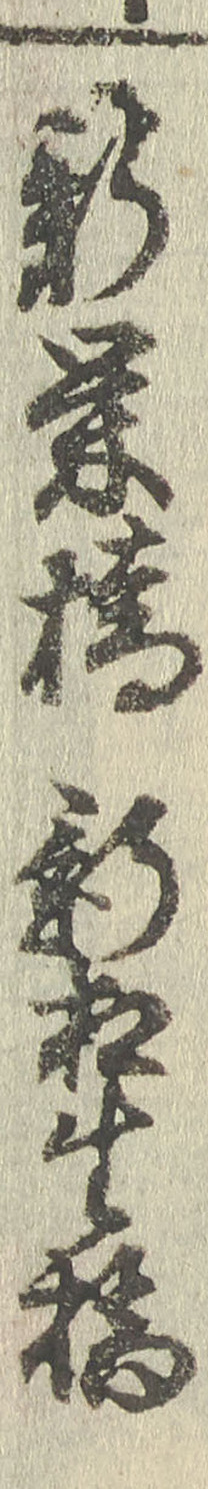新栄橋新相生橋
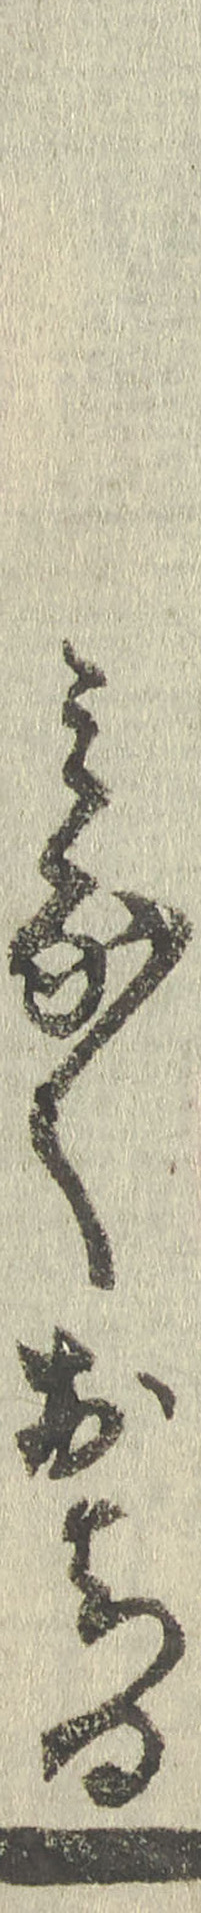みな〳〵おちる
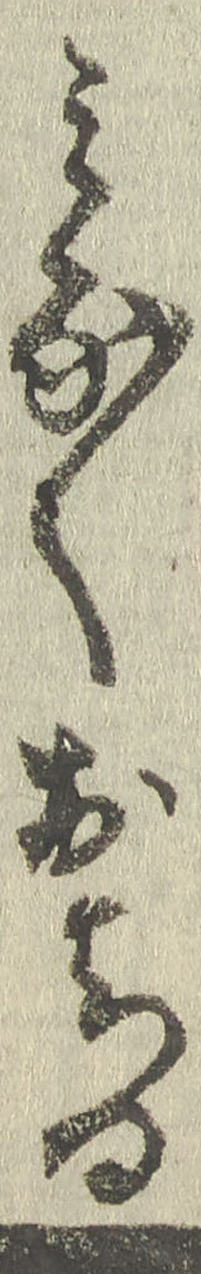みな〳〵おちる
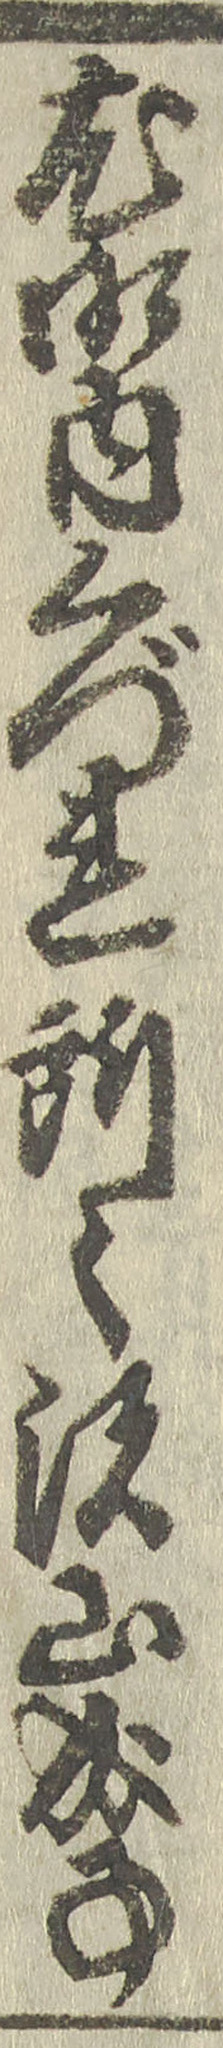尤町内くづれ所々沢山成事
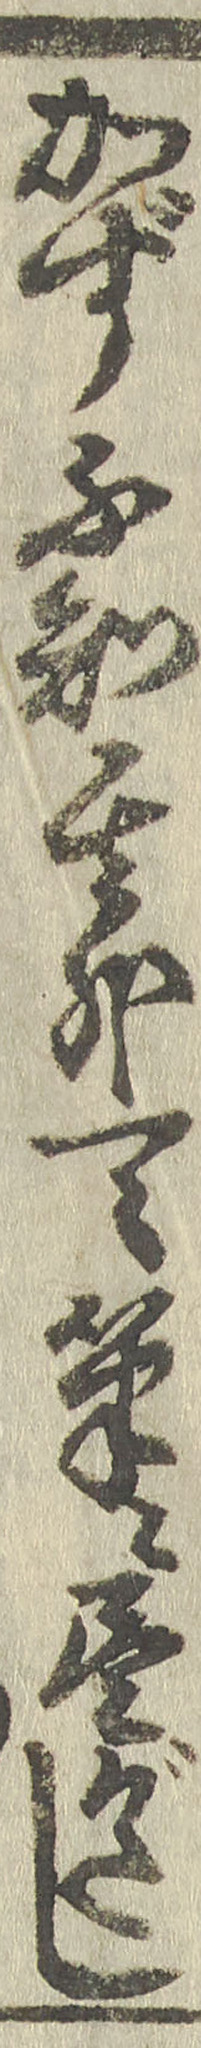かず不知其外一々筆に尽がたし
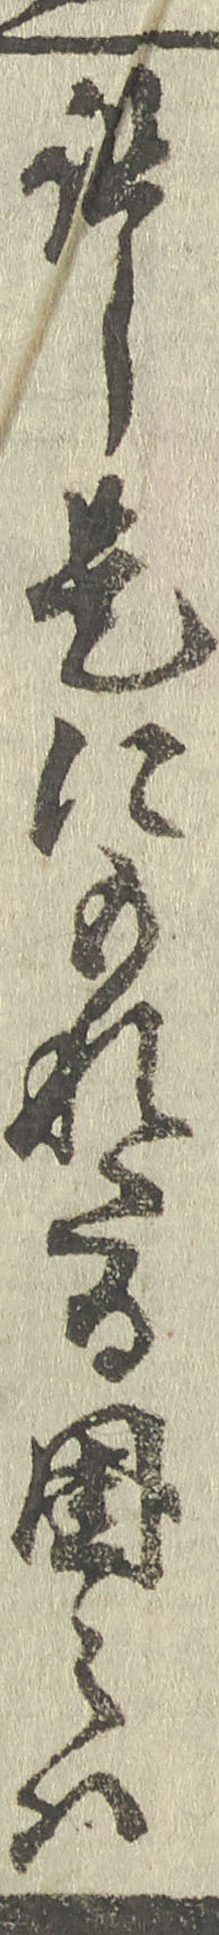但し是にもれたる国々は
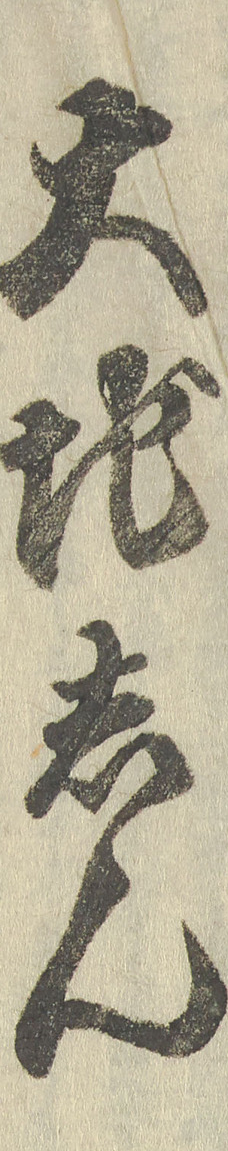大地しん
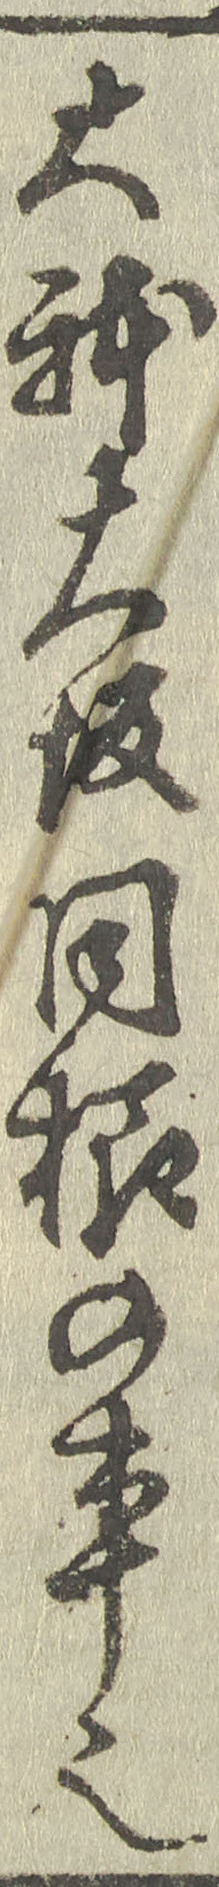大体大坂同様の事也
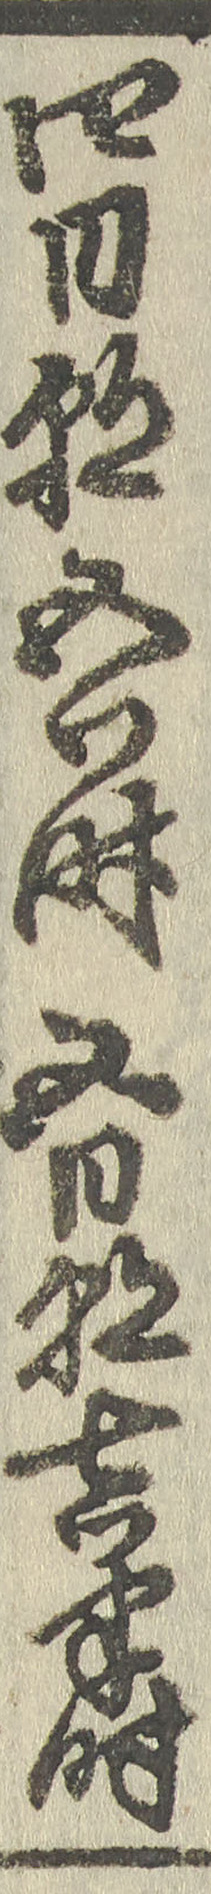四日朝五ツ時五日朝七ツ半時
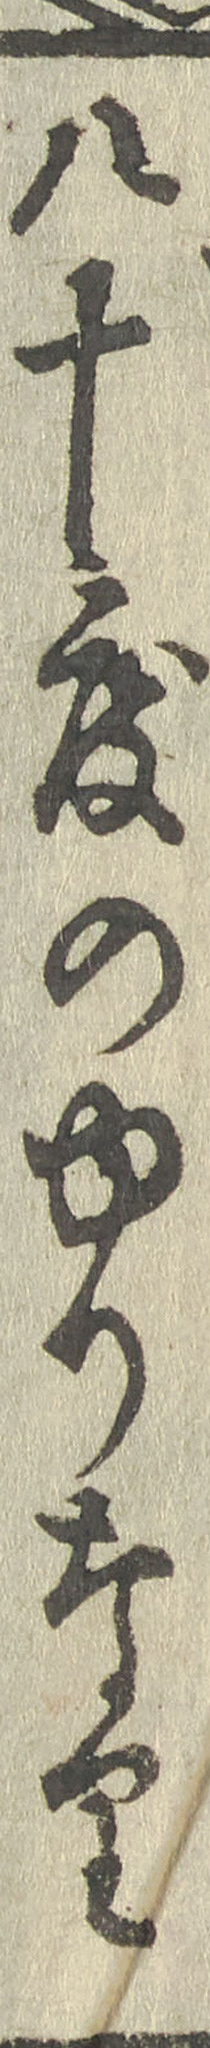八十度のゆりなり
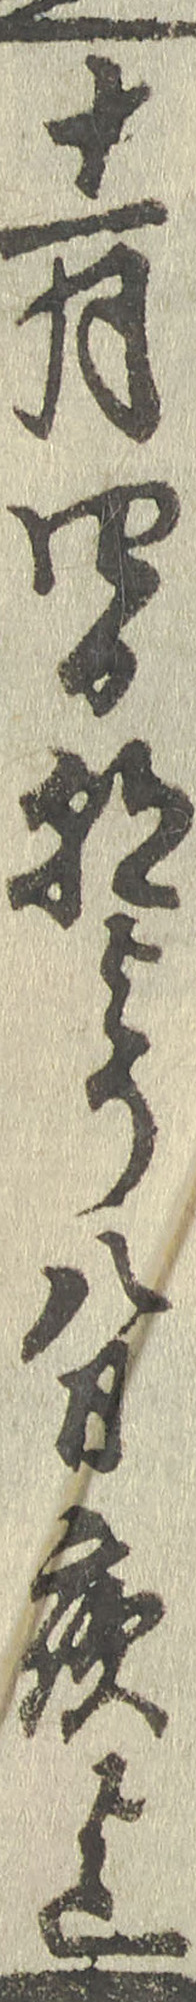十一月四日朝より八日夜迄
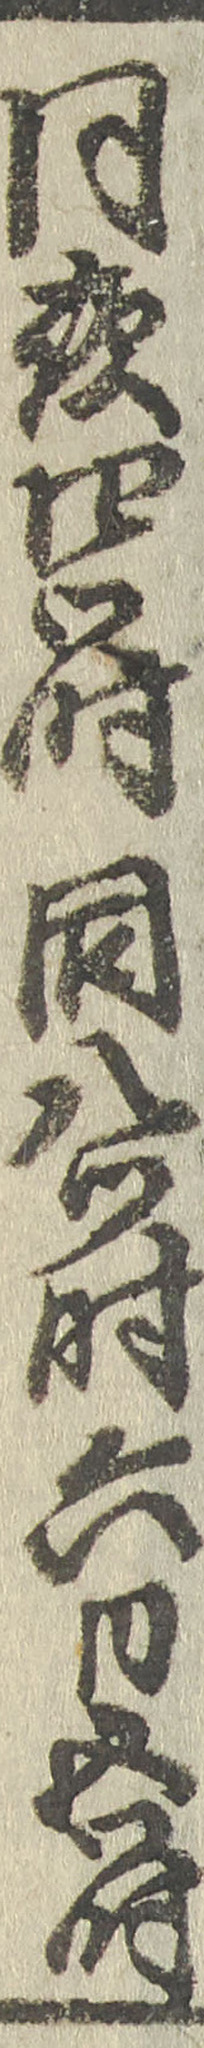同夜四ツ時同八ツ時六日五ツ時
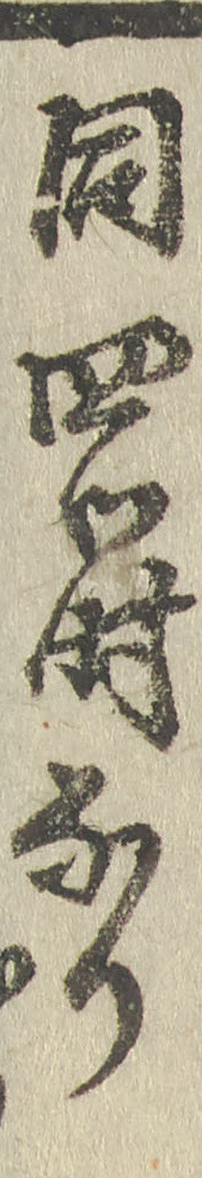同四ツ時なり
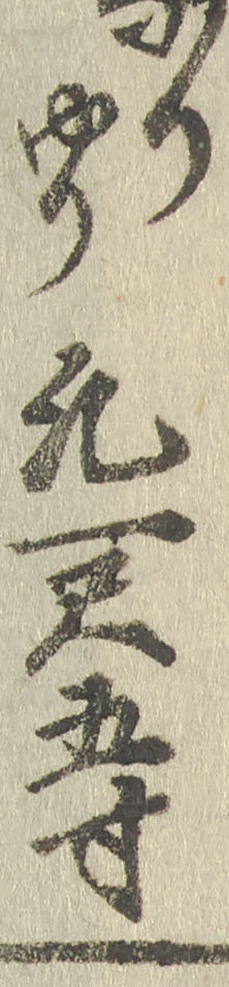ゆり凡一尺五寸
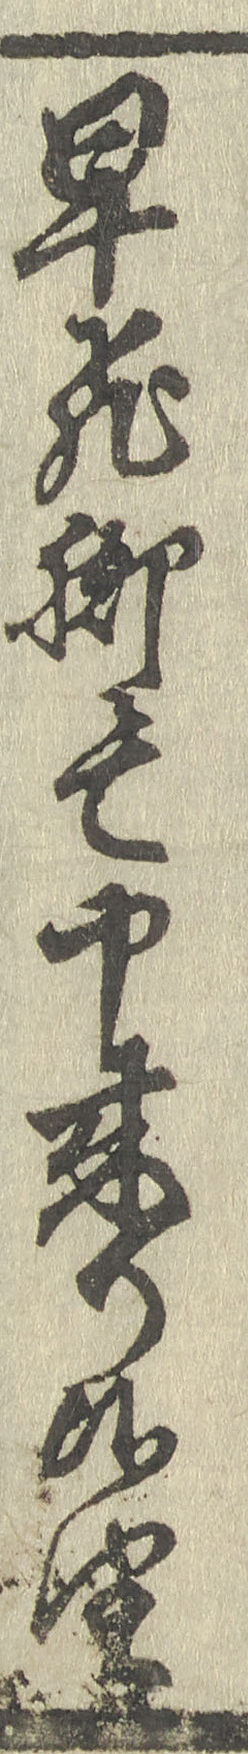早飛脚にて申来り候由
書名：聞書東海道南海道国々大地震大つなミ
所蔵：東京大学総合図書館 General Library in the University of Tokyo, JAPAN
